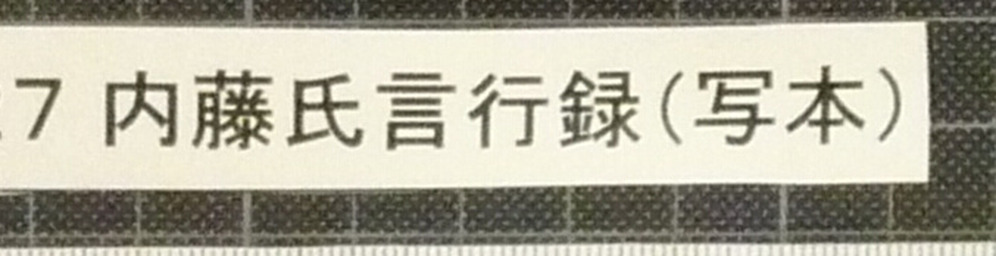内藤家言行録全
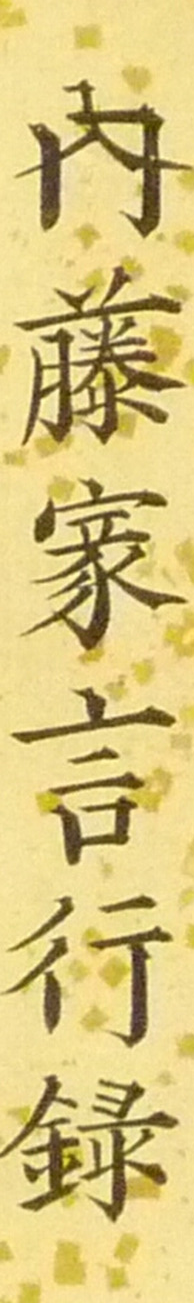内藤家言行録全

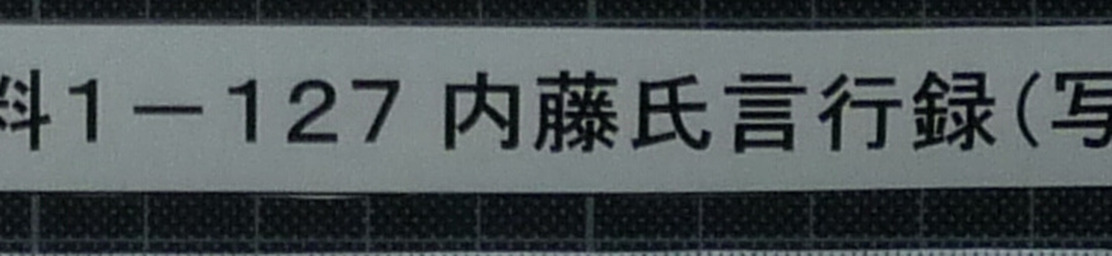内藤家言行録
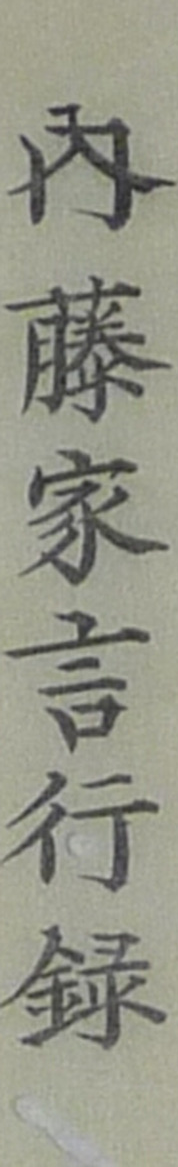内藤家言行録
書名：内藤家言行録（写本）
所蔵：伊那市立高遠町図書館・合同会社AMANE
